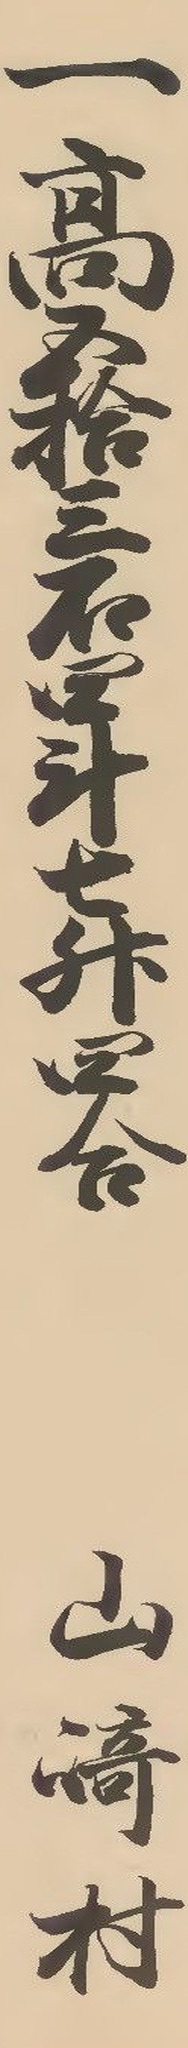一髙五拾三石四斗七升四合山崎村
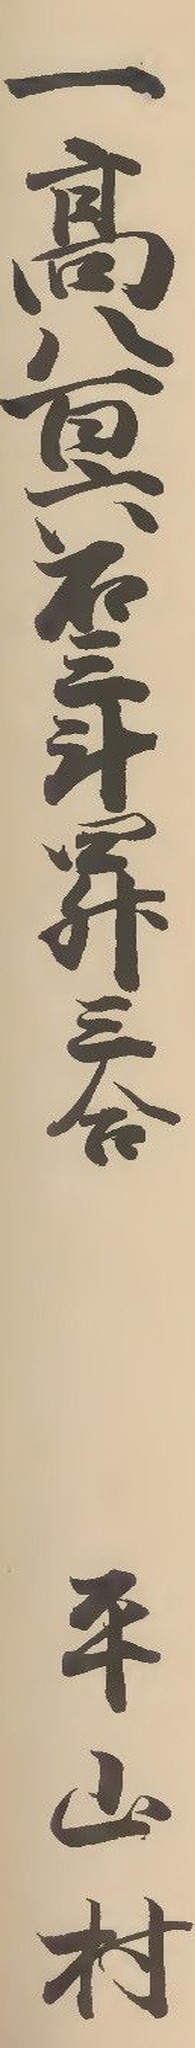一髙八百六石三斗四升三合平山村
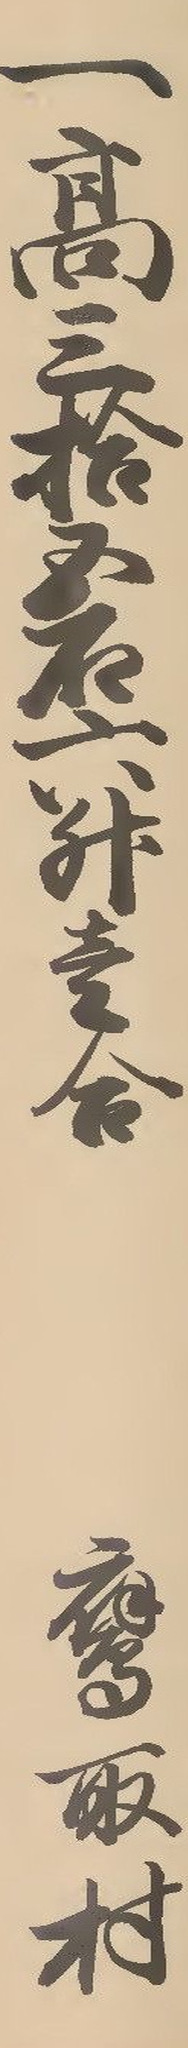一髙三拾五石六升壱合鷹取村
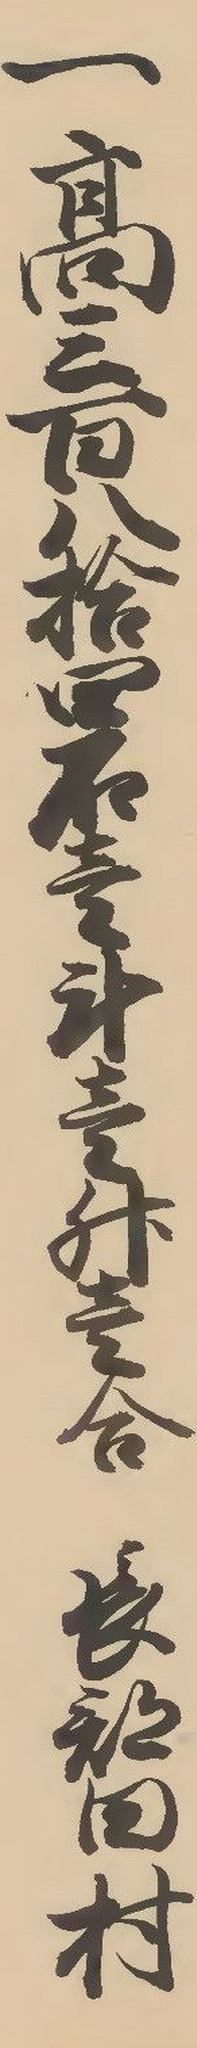一髙三百八拾四石壱斗壱升壱合長部田村
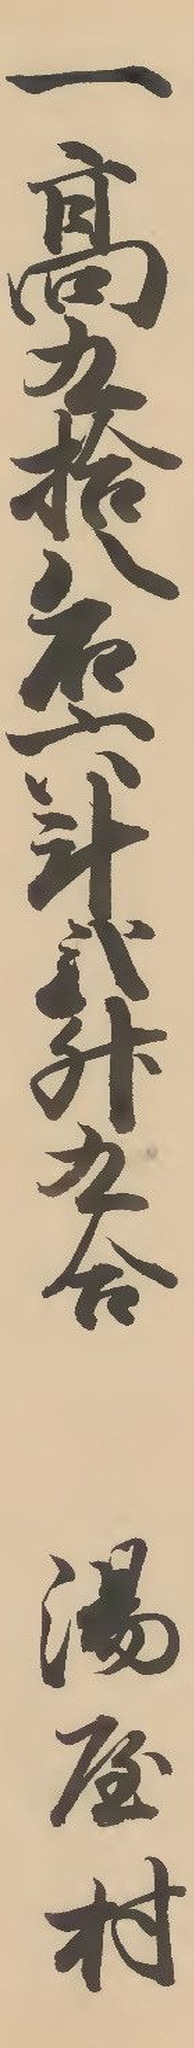一髙九拾八石六斗弐升九合湯屋村
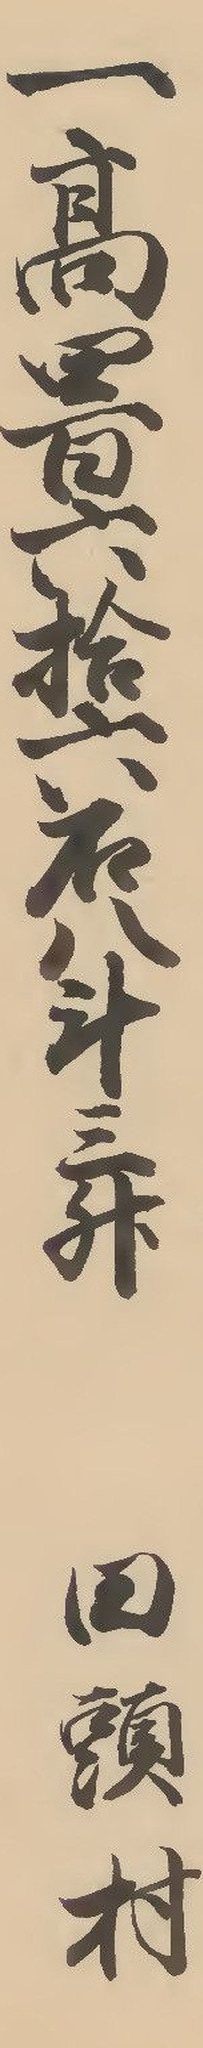一髙四百六拾六石八斗三升田頭村

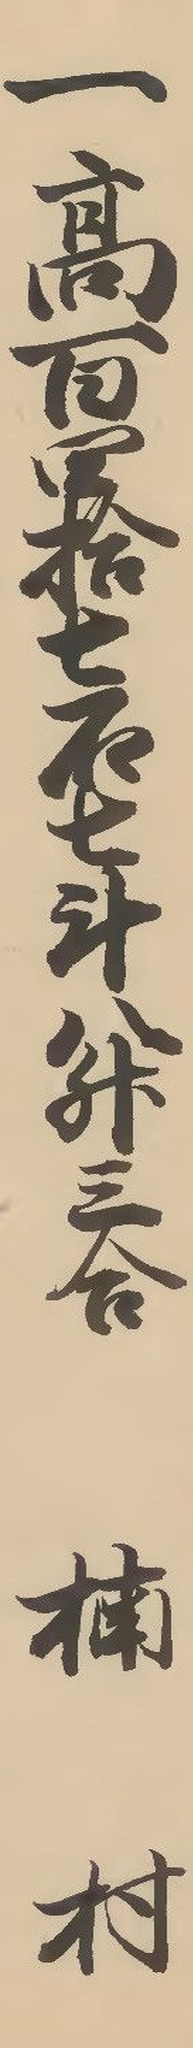一髙百四拾七石七斗八升三合楠村
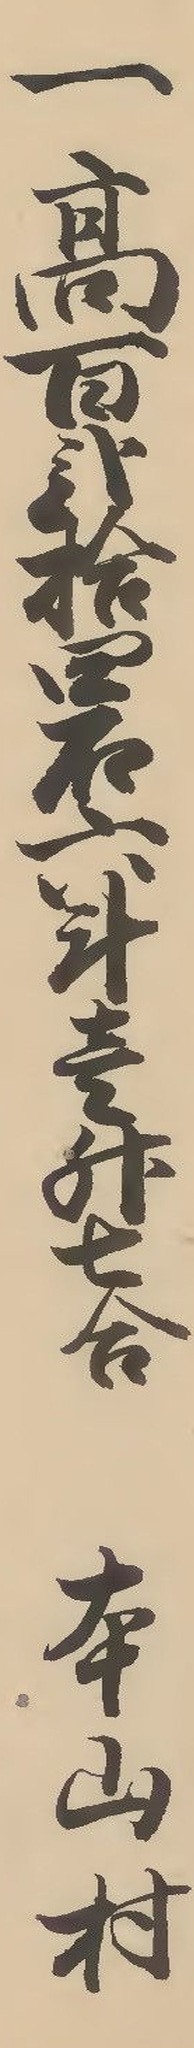一髙百弐拾四石六斗壱升七合本山村
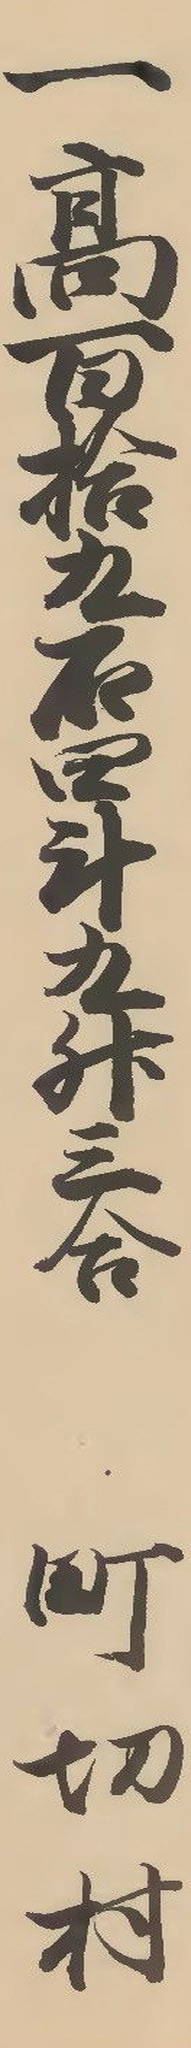一髙百拾九石四斗九升三合町切村
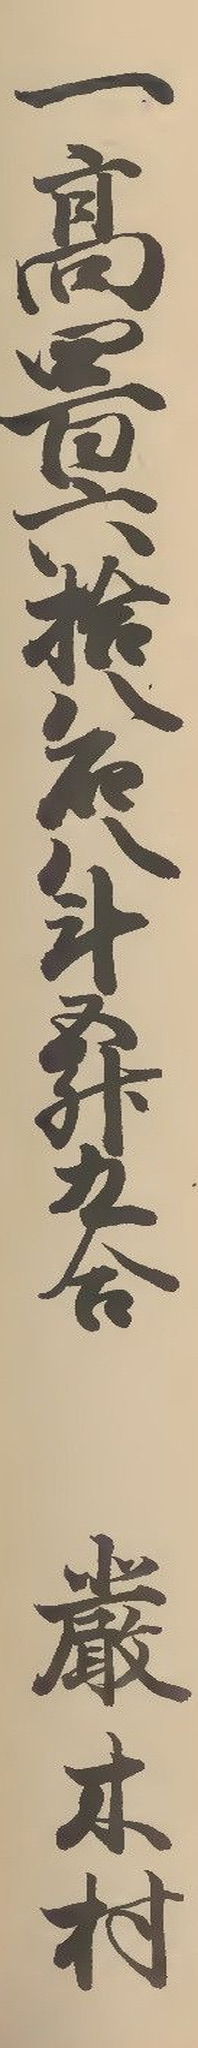一髙四百六拾八石八斗五升九合巖木村
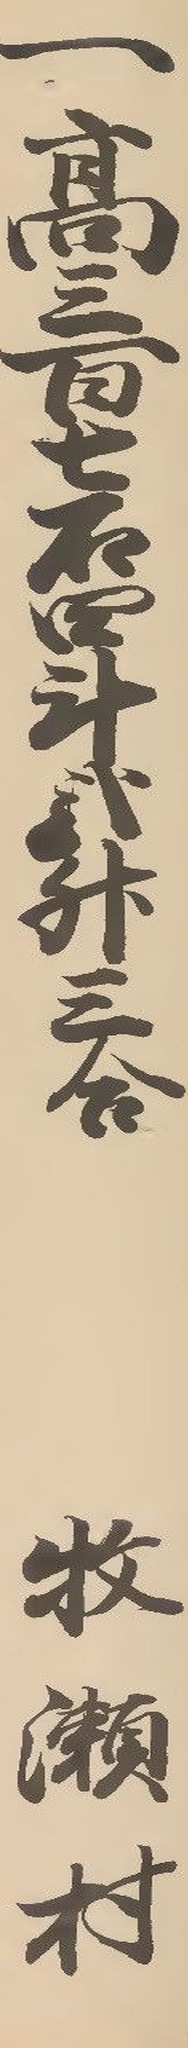一髙三百七石四斗弐升三合牧瀬村
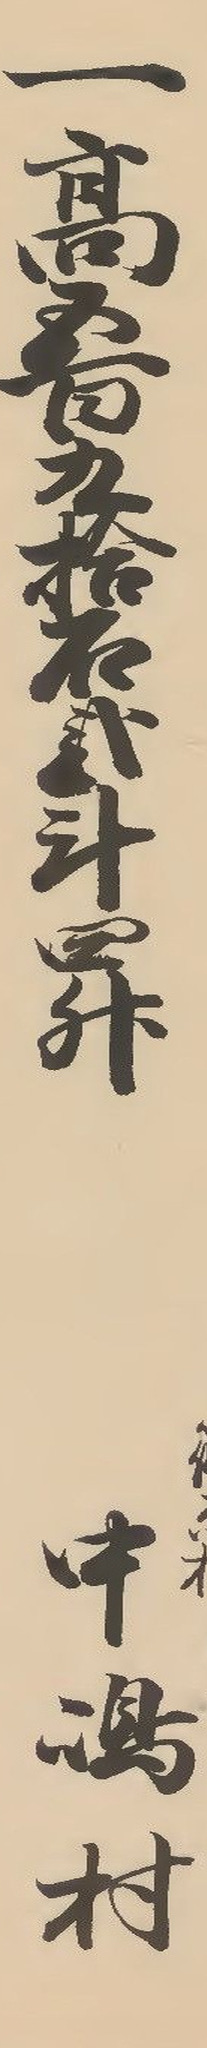一髙五百九拾石弐斗四升中嶋村
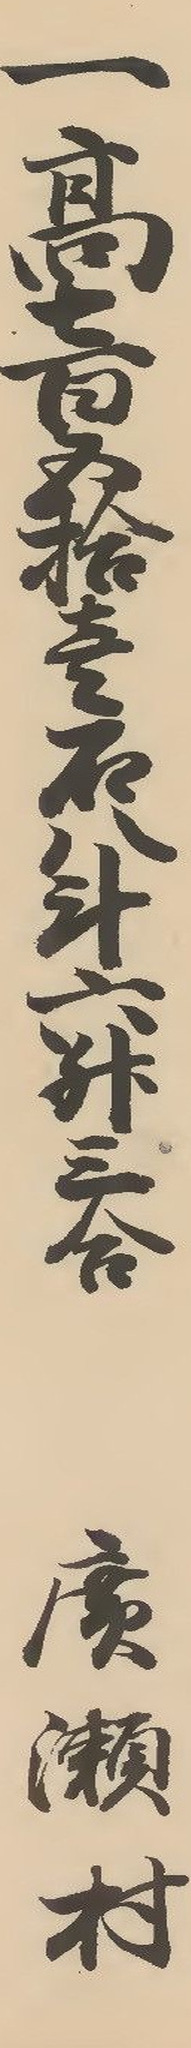一髙七百五拾壱石八斗六升三合広瀬村
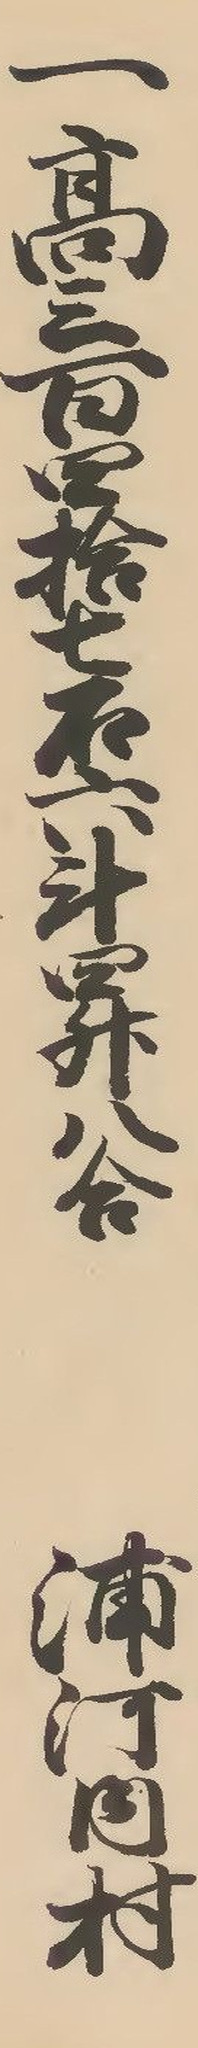一髙三百四拾七石六斗四升八合浦河内村

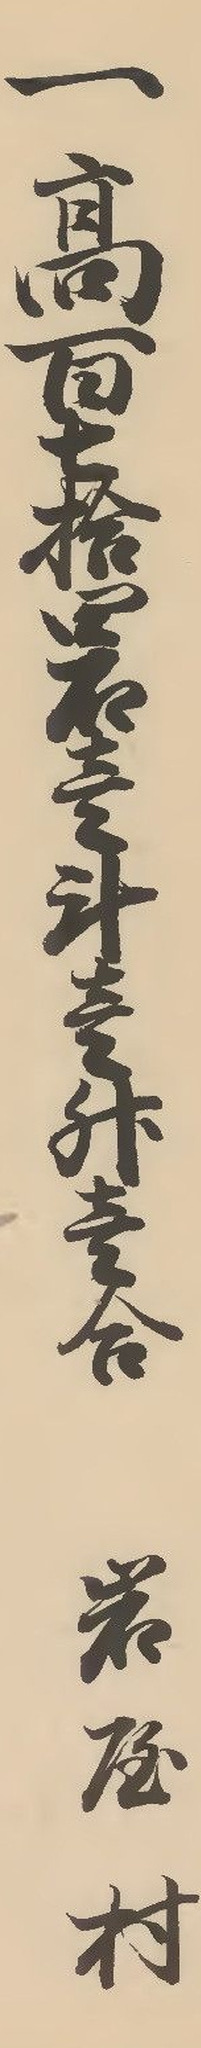一髙百七拾四石壱斗壱升壱合岩屋村
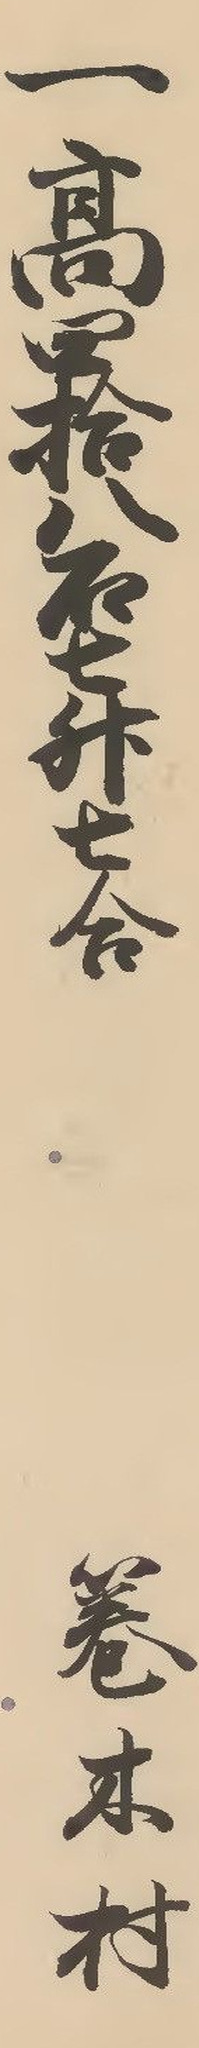一髙四拾八石七升七合巻木村
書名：肥前国郷帳
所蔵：国立公文書館 National Archives of Japan
